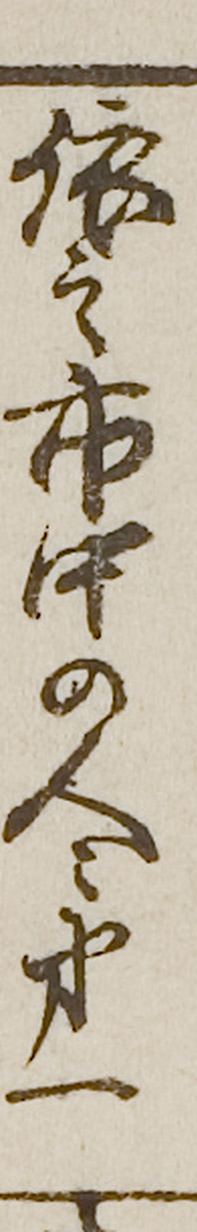依之市中之人々第一
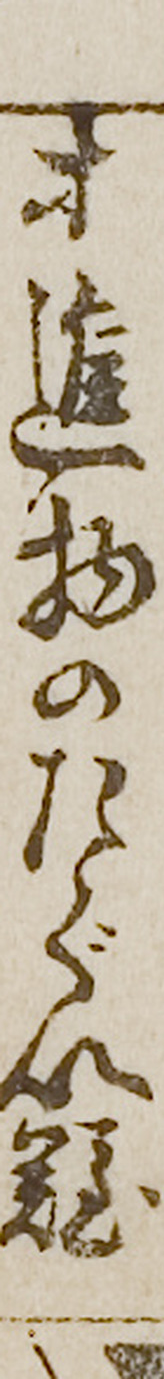等進物のたぐい難
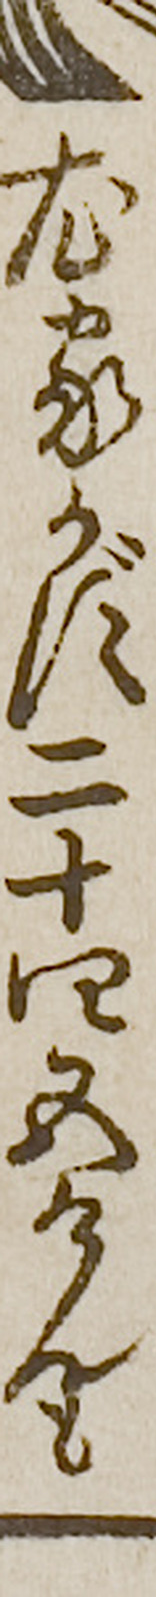尤家かず二十四五けんも
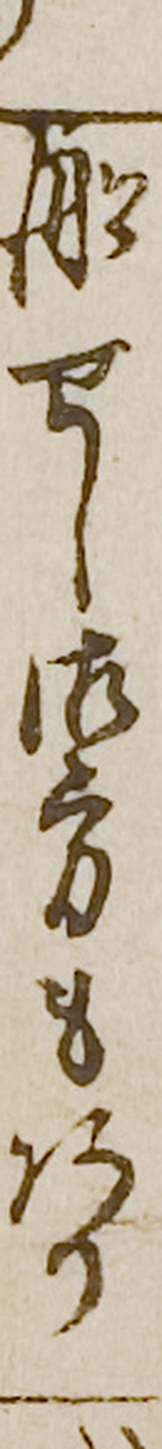船せし御方もあり
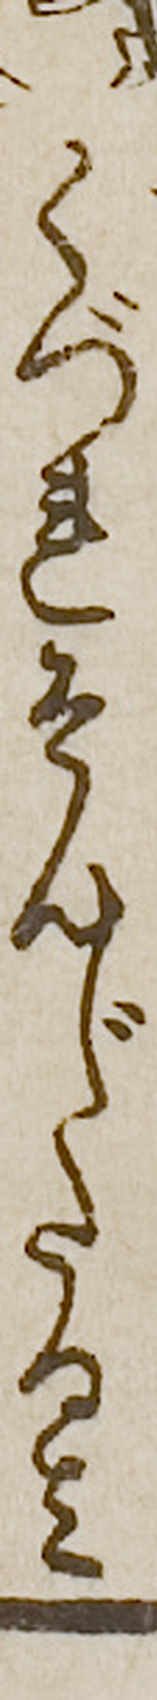くづれそんじたるは
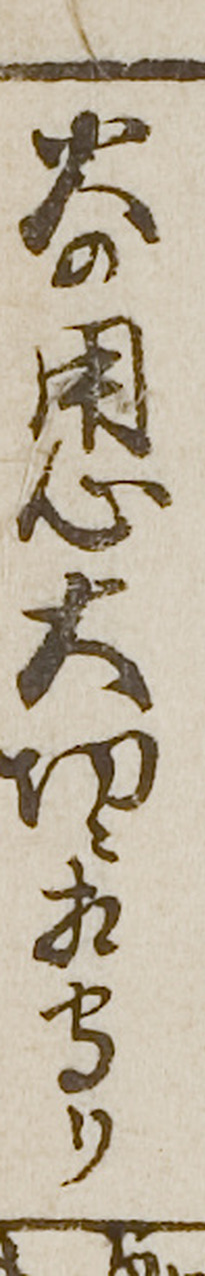火の用心大切に相守り
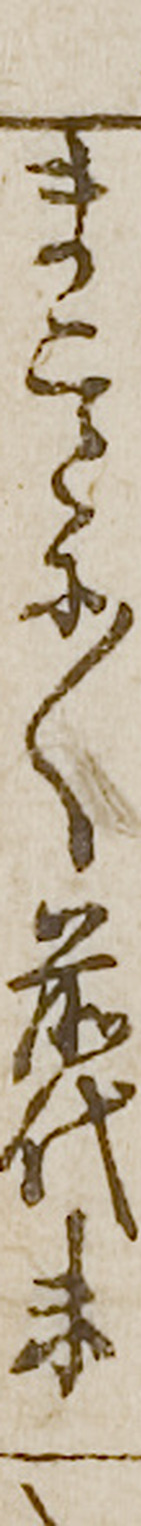まことに〳〵前代未
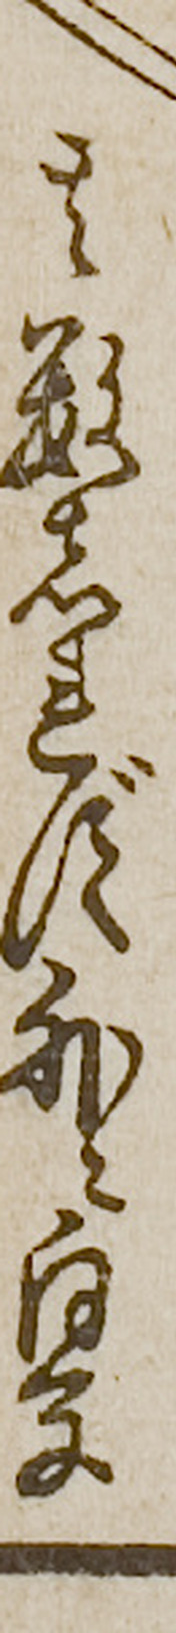其数しれず外に白子
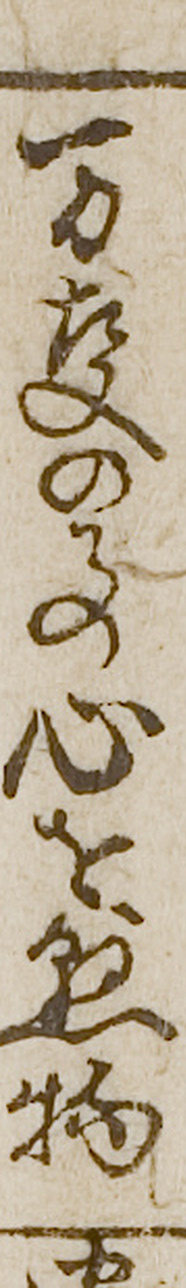万事の事心を懸物
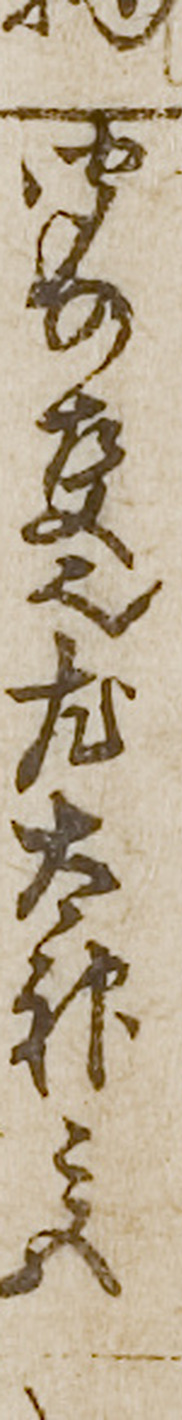聞の事也尤太神々五
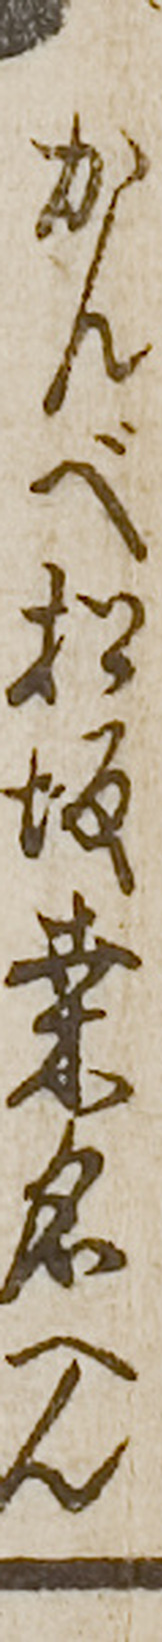かんべ松坂桑名へん
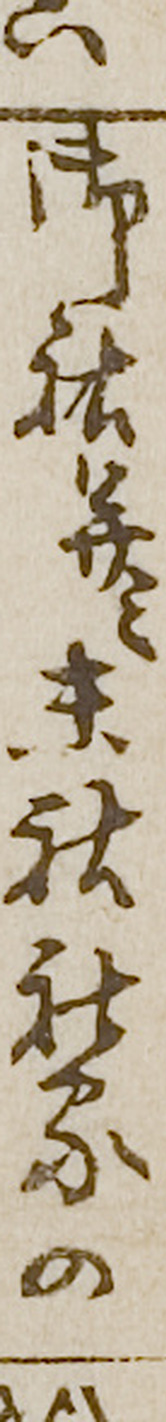御社并に末社社家の
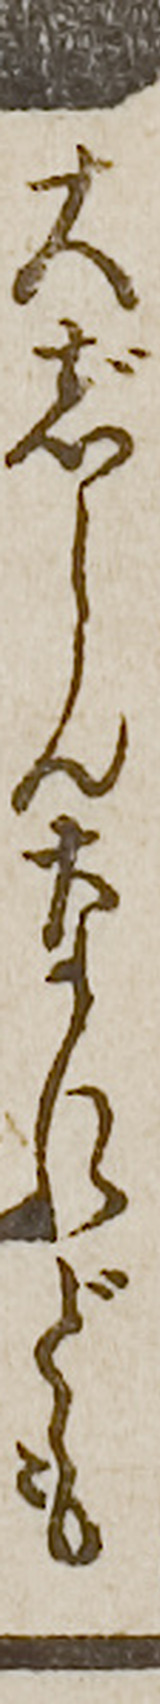大じしんなれども
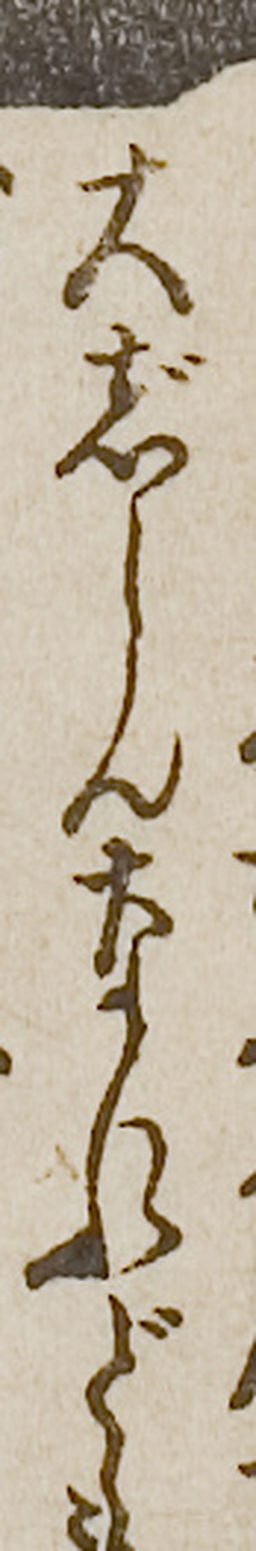大じしんなれども
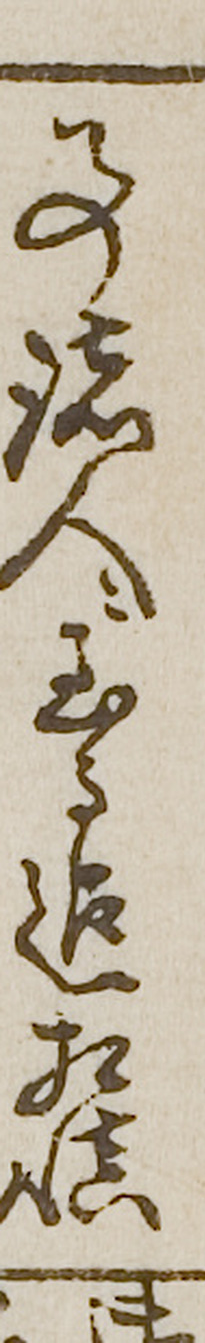事諸人に至る迄相慎
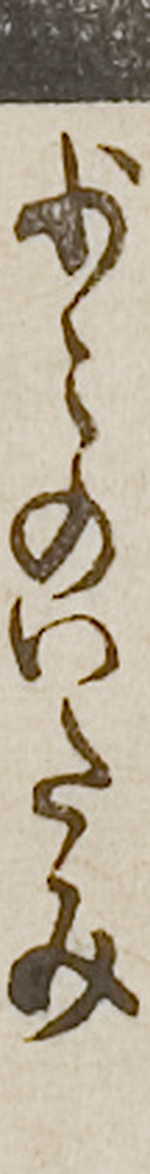少々のいたみ
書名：諸国大地震大津波 三編
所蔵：東京大学総合図書館 General Library in the University of Tokyo, JAPAN
